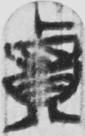貴
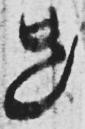也
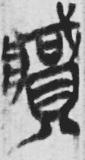贓（將）
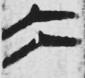大
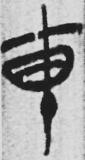車
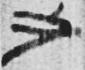之
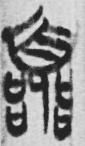囂
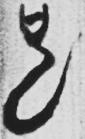也
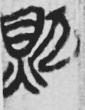則（則）
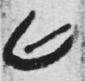㠯（以）
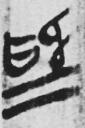爲
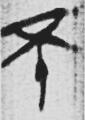不
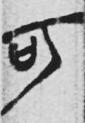可
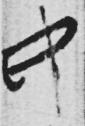女（如）
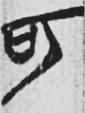可（何）
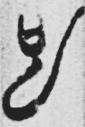也
